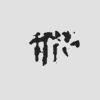神
